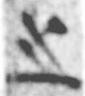之
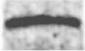一
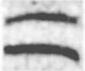二
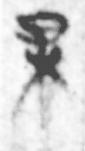果（戈）
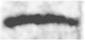一
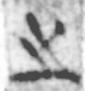之
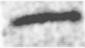一
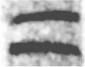二
